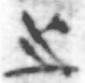之
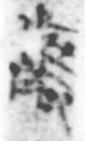雘
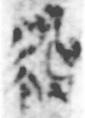紳（靷）
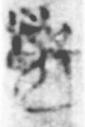○（豻）
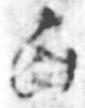首
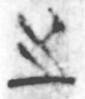之
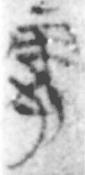○（蒙）
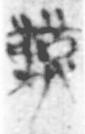鞁
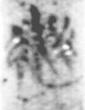○（轡）
